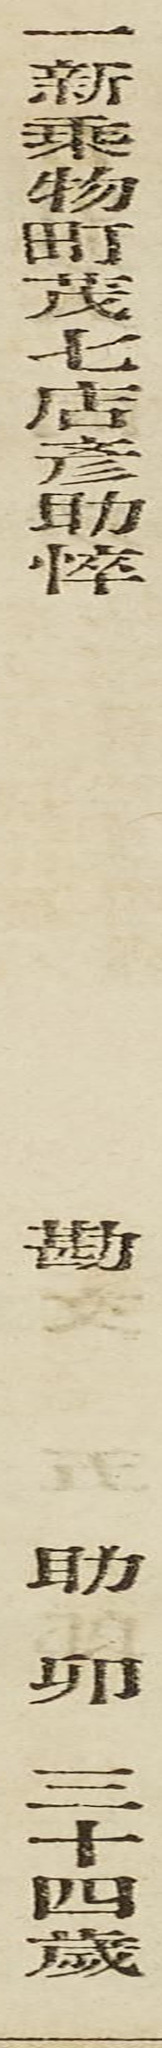一新乗物町茂七店彦助倅勘助卯三十四歳
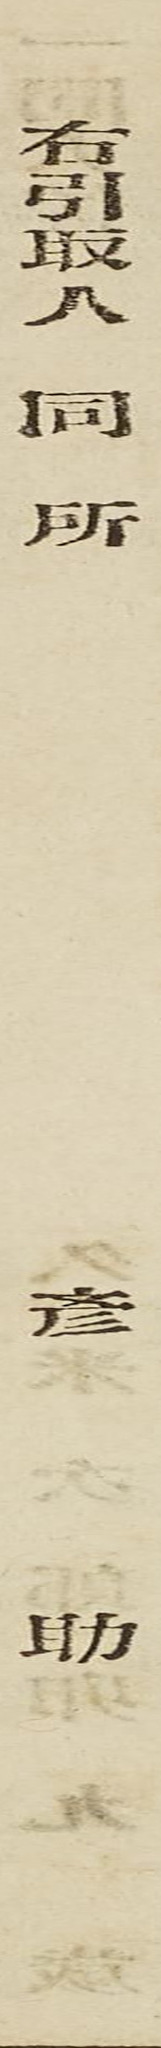右引取人同所彦助
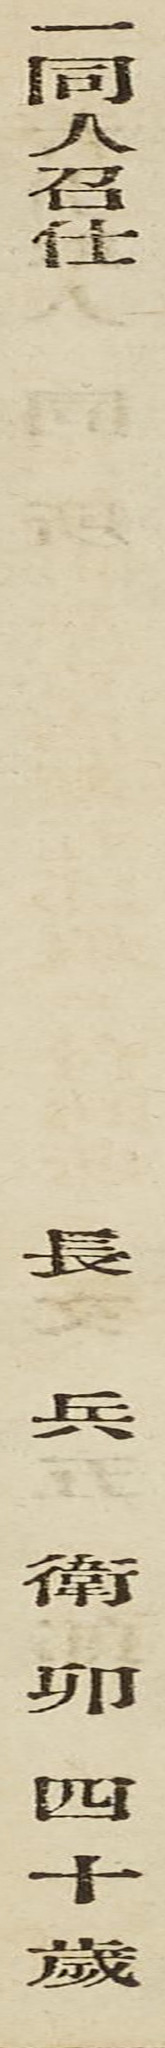一同人召仕長兵衛卯四十歳
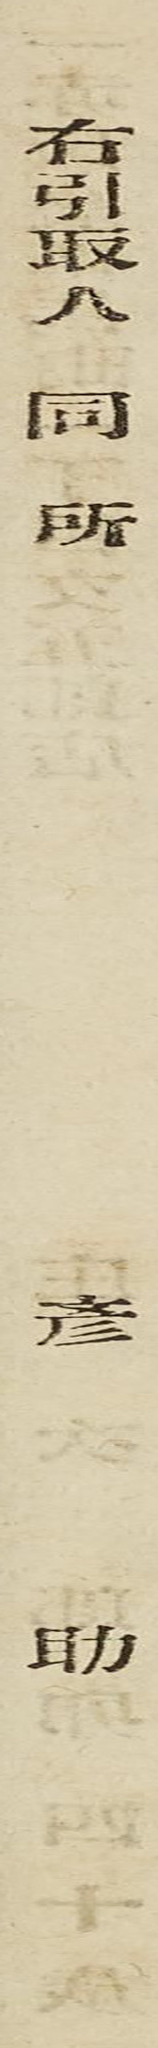右引取人同所彦助
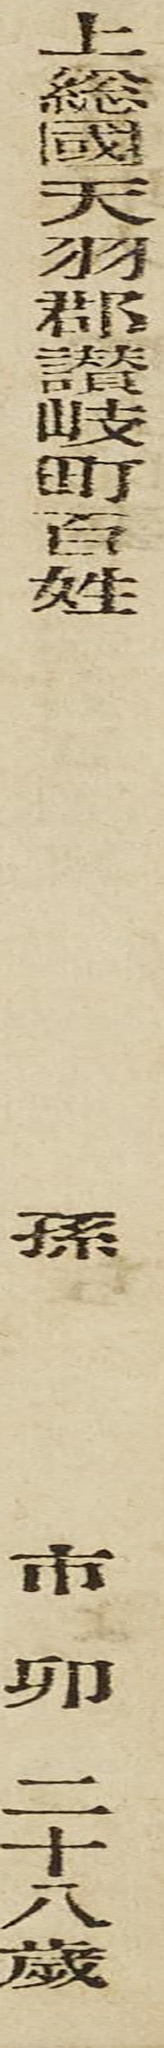一上総国天羽郡讃岐町百姓孫市卯二十八歳
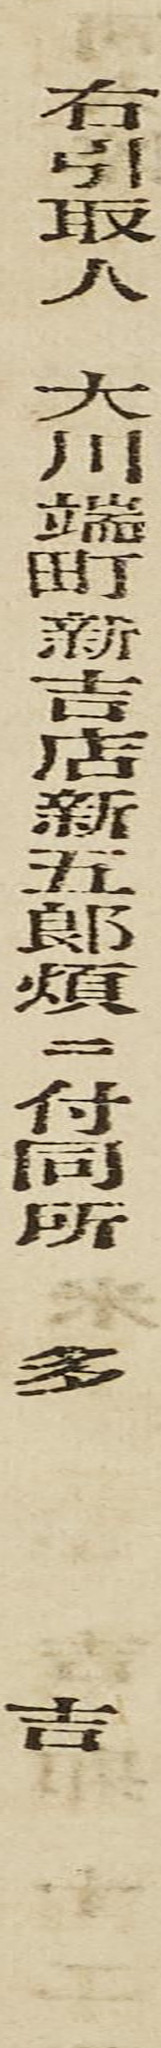右引取人大川畑町新吉店新五郎煩ニ付同所多吉
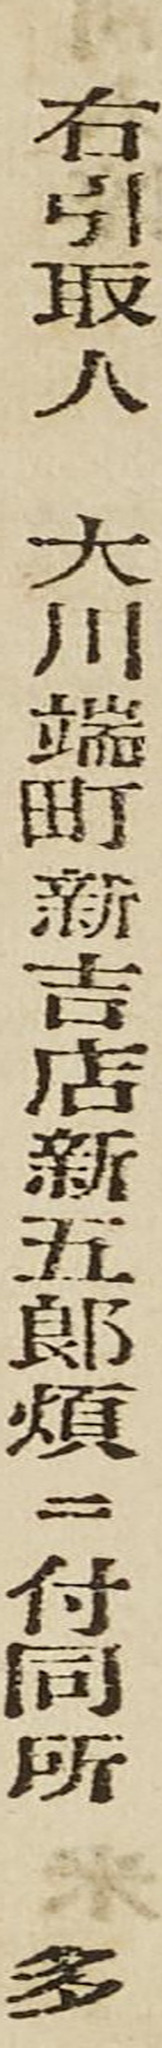右引取人大川畑町新吉店新五郎煩ニ付同所多吉
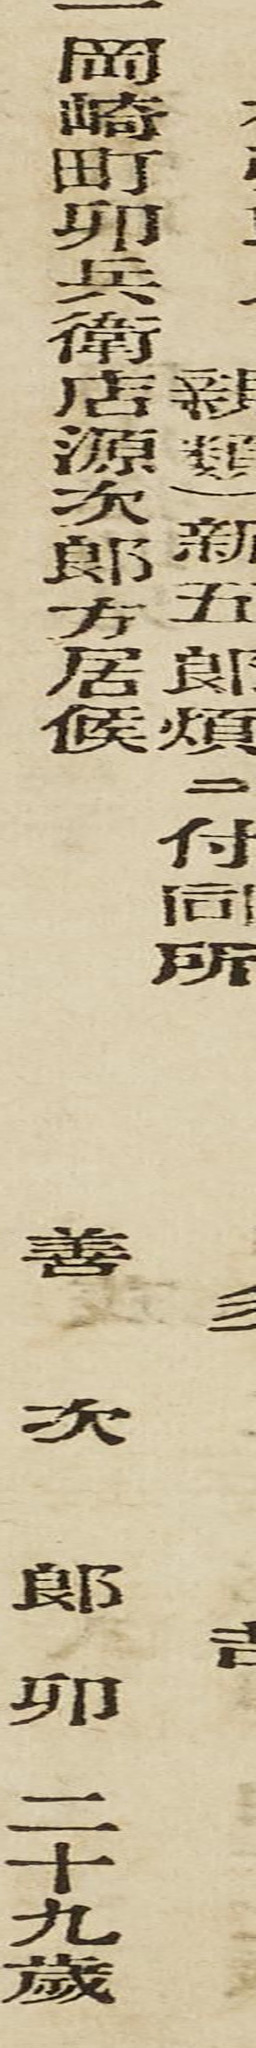一岡崎町卯兵衛店源次郎方居候善次郎卯二十九歳
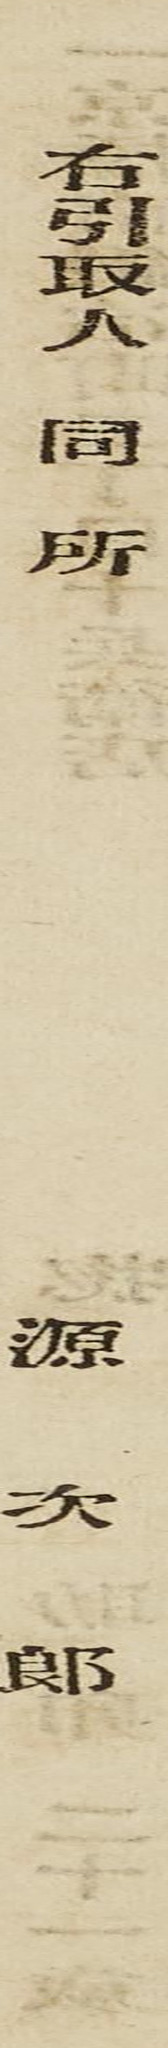右引取人同所源次郎
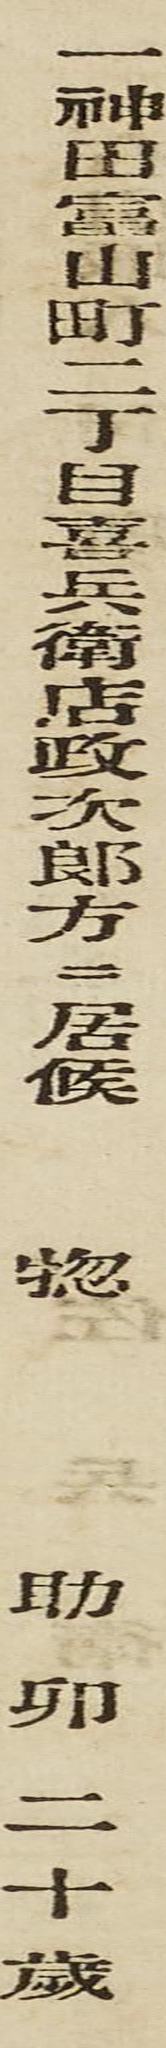一神田富山町二丁目喜兵衛店政次郎方ニ居候惣助卯二十歳
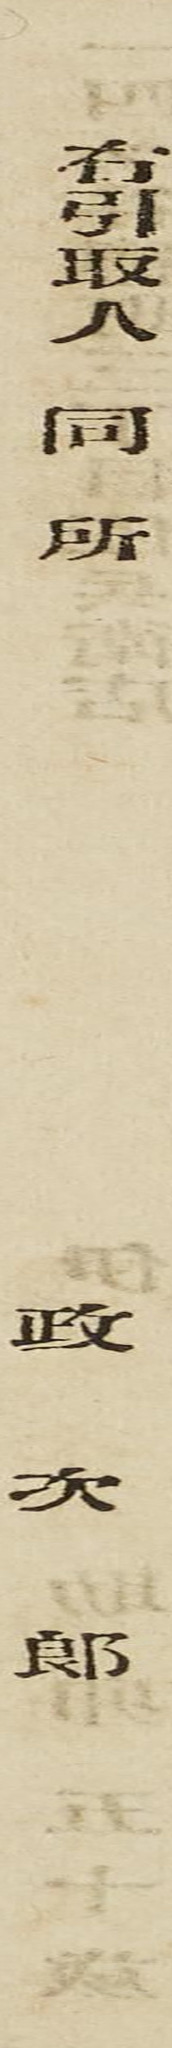右引取人同所政次郎
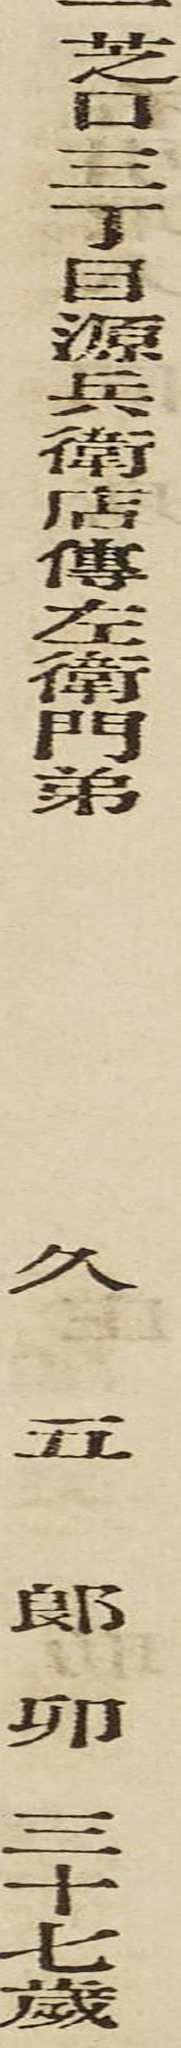一芝口三丁目源兵衛店傳左衛門弟久五郎卯三十七歳
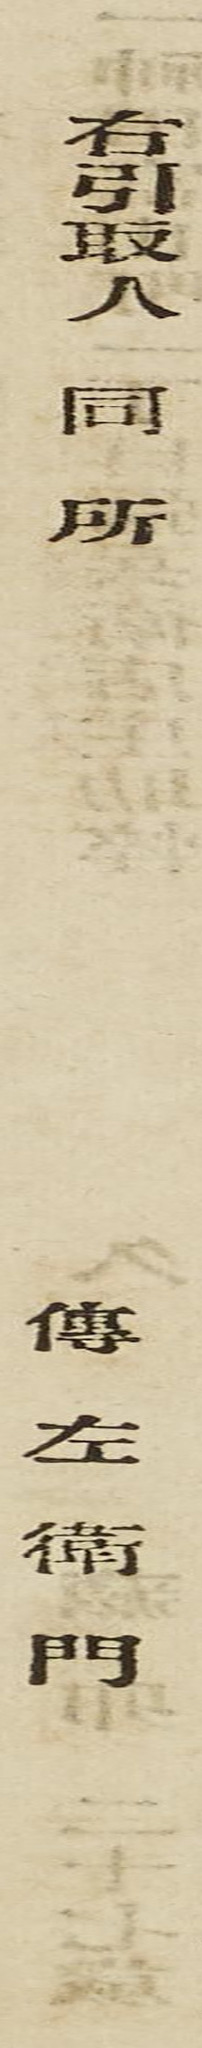右引取人同所傳左衛門
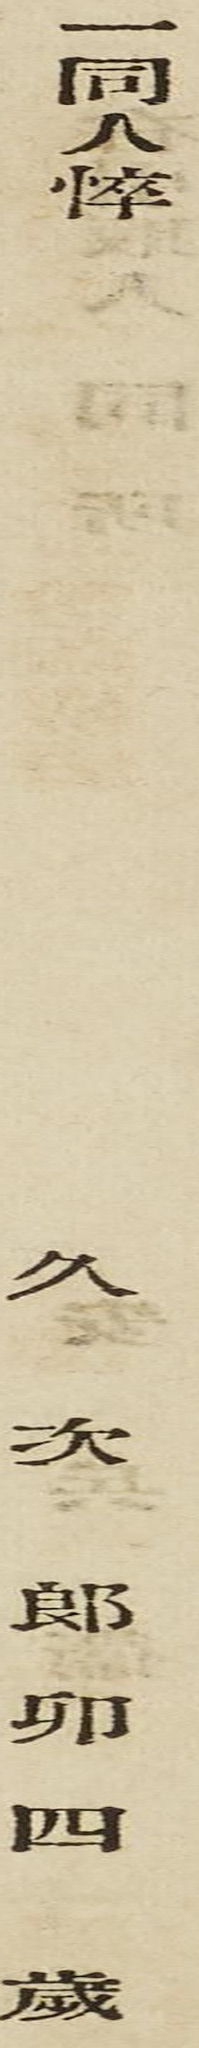一同人倅久次郎卯四歳
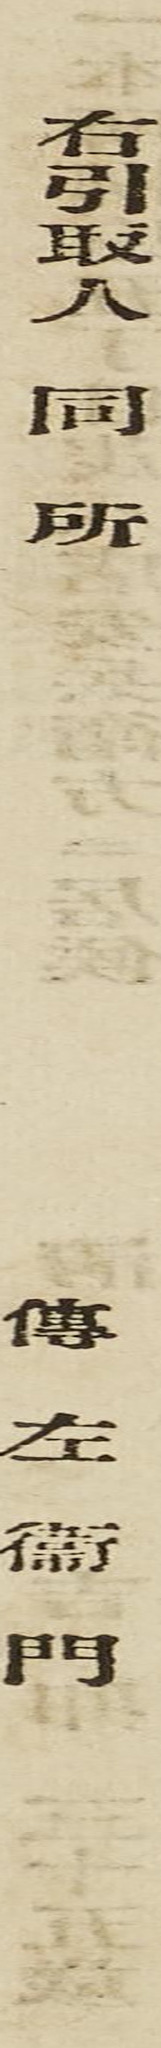右引取人同所傳左衛門
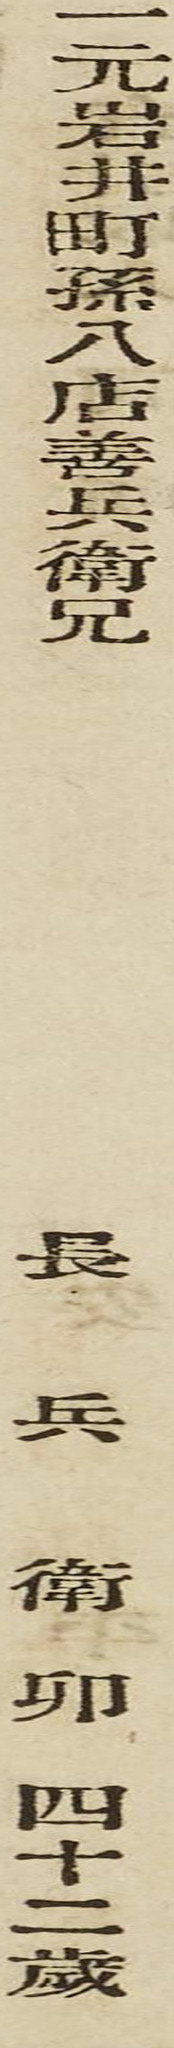一元岩井町孫八店善兵衛兄長兵衛卯四十二歳
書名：永代惨話　文化の夢　全
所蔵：東京大学地震研究所図書室 Earthquake Research Institute Library, The University of Tokyo, JAPAN
